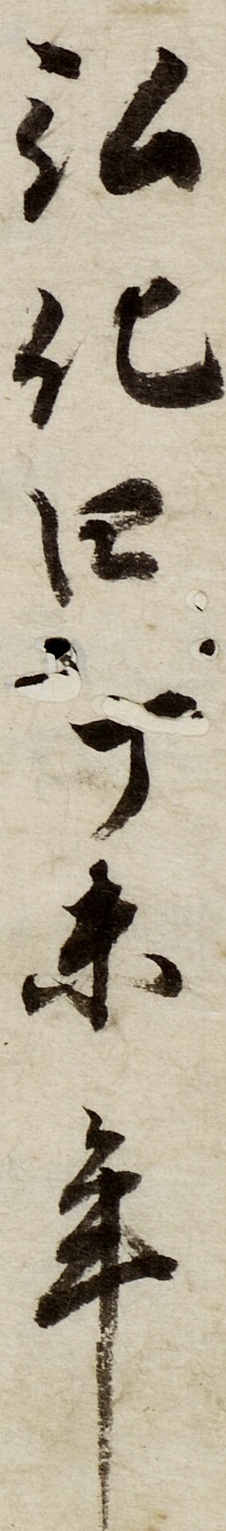弘化四丁未年
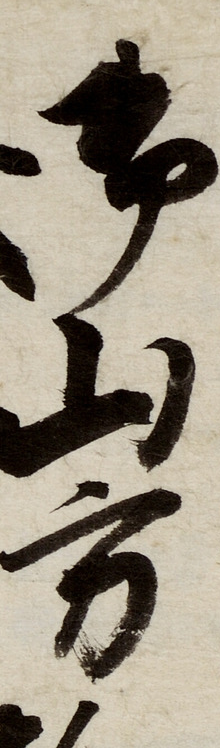御山方
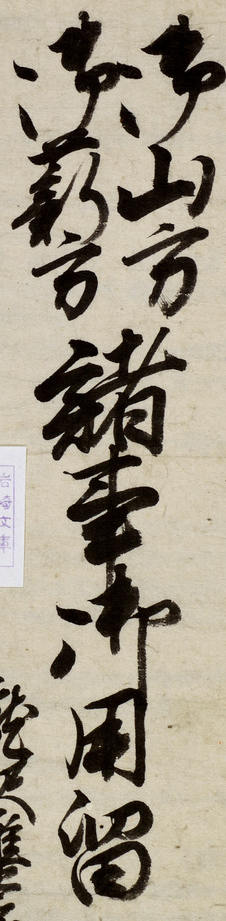御薪方諸事御用留
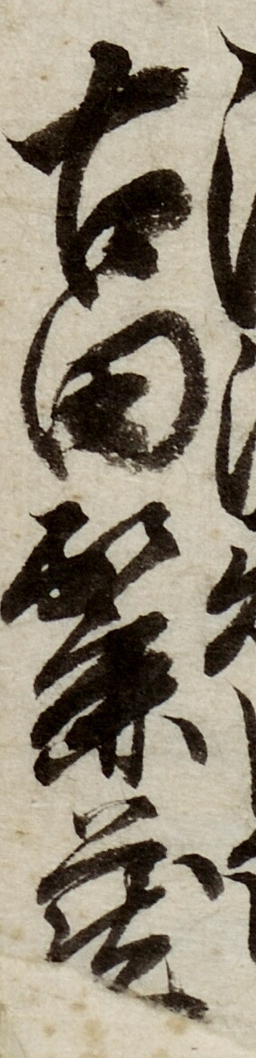古田簏蔵
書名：御山方御薪方諸事御用留
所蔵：伊那市立高遠町図書館・合同会社AMANE
